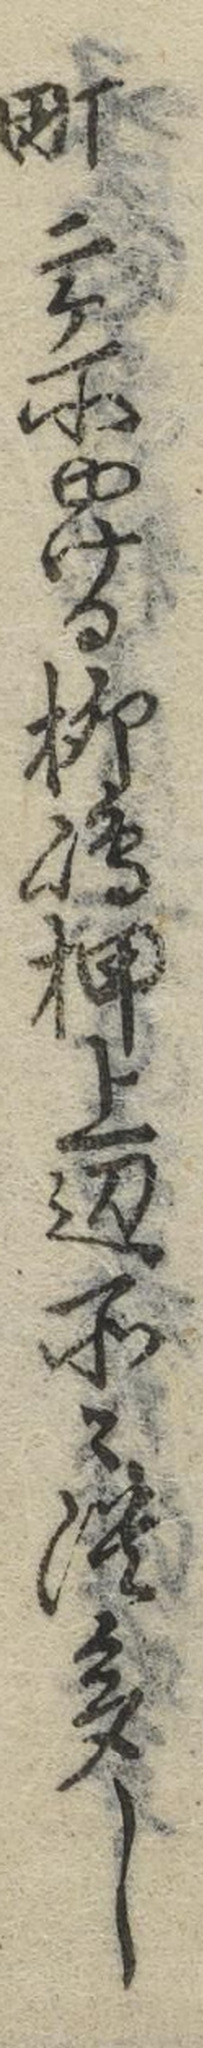町二ケ所やける柳橋押上辺所〻潰多し
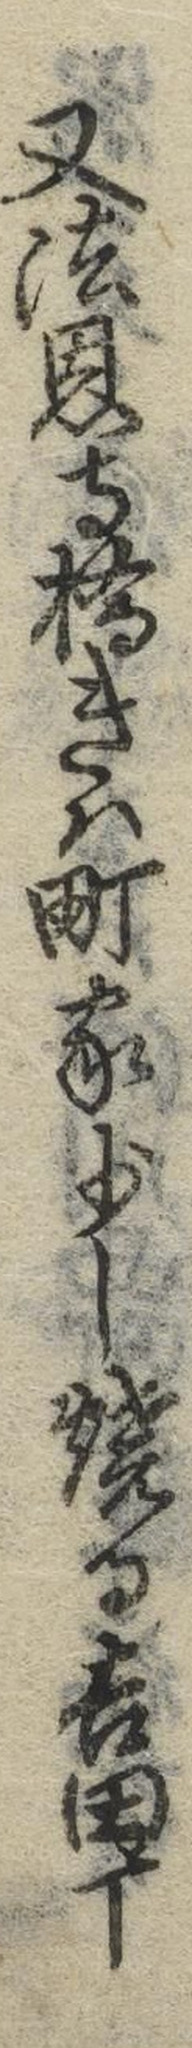又法恩寺橋きハ町家少し焼る吉田丁
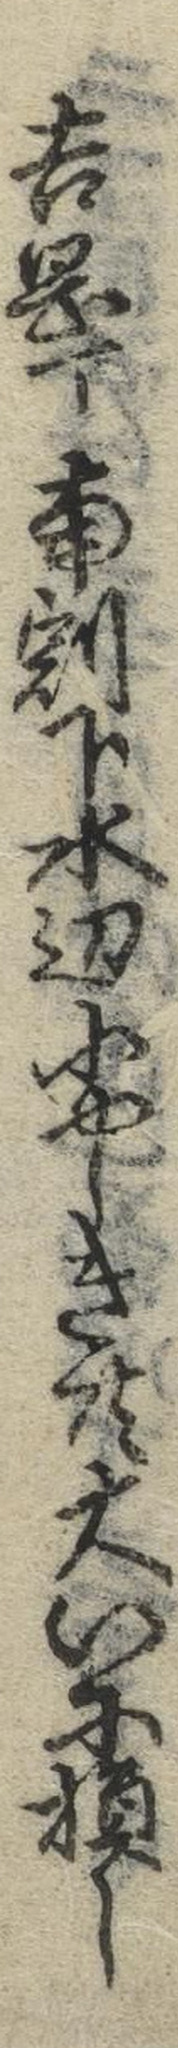吉岡丁南割下水辺小やしき共大いに損し
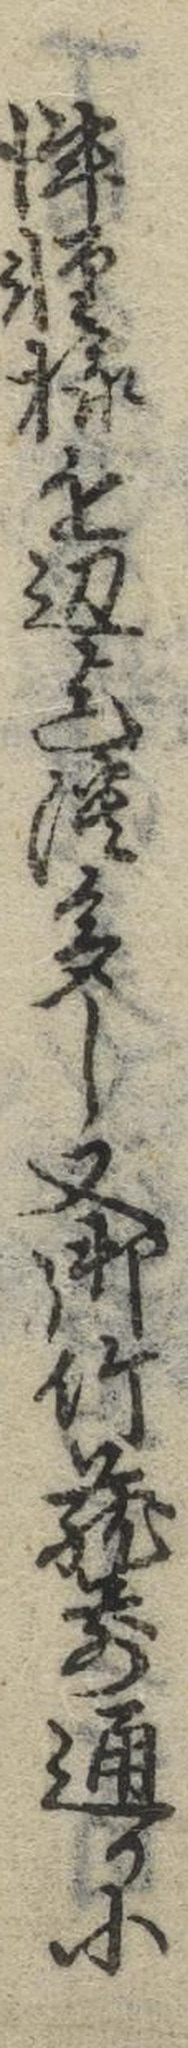津軽様近辺迄潰多し又御竹蔵前通り小
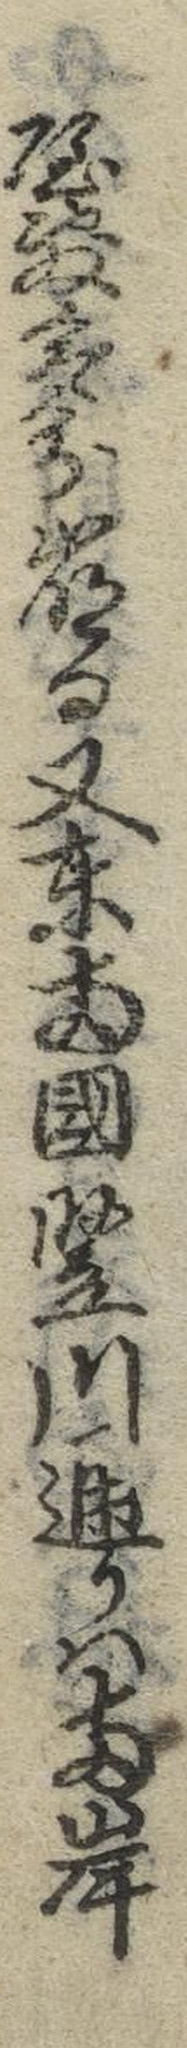屋敷多分崩る又東両国竪川通りハ両岸
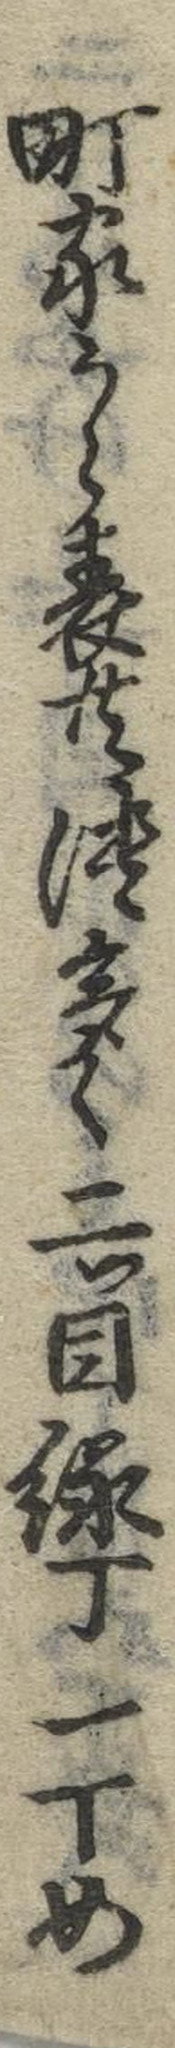町家うら表共潰多く二ツ目緑一丁め

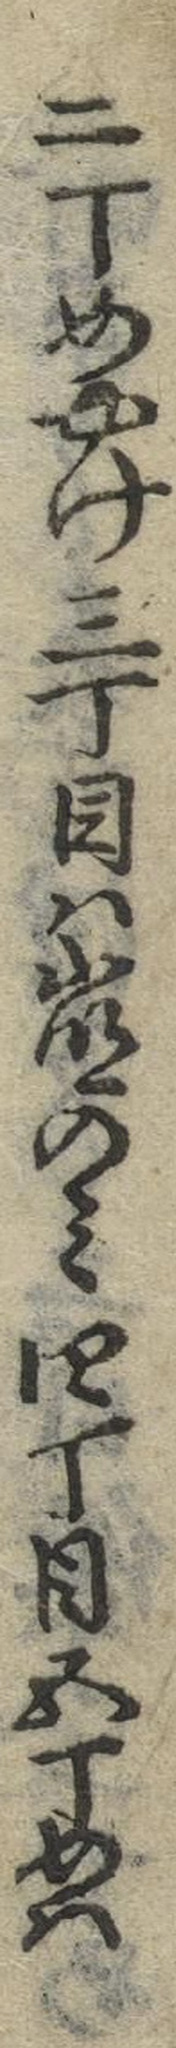二丁めやけ三丁目ハ崩のミ四丁目五丁めハ
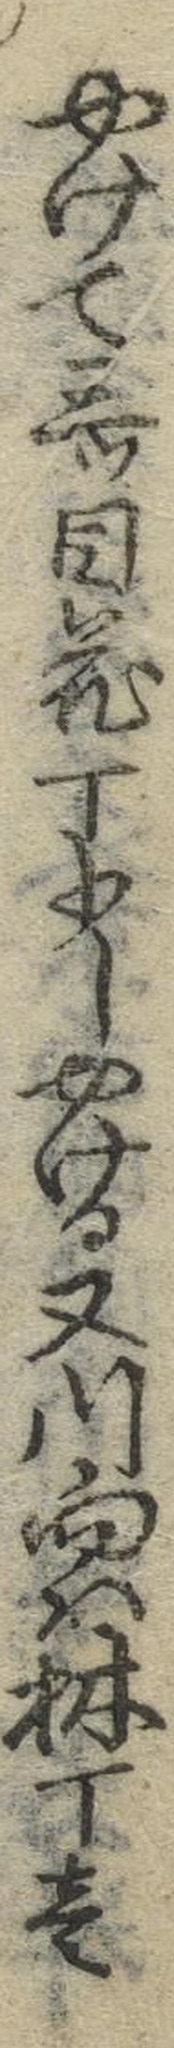やけて三ツ目花丁少しやける又川向ハ林丁壱
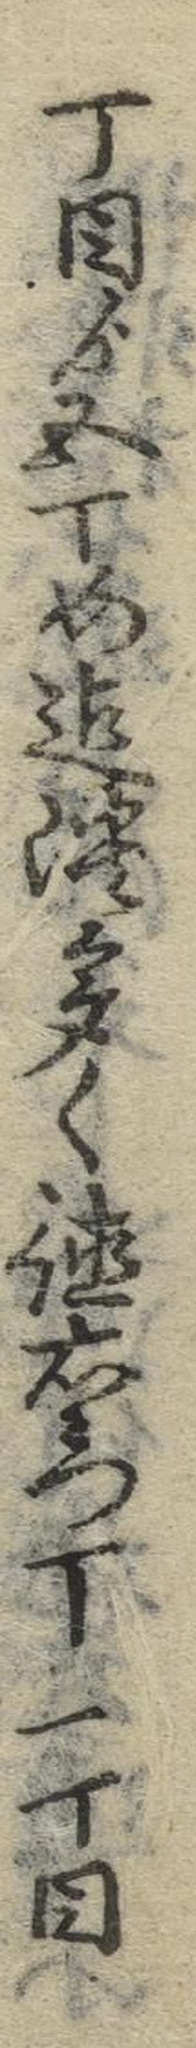丁目ゟ五丁め迄潰多く徳右衛門丁一丁目
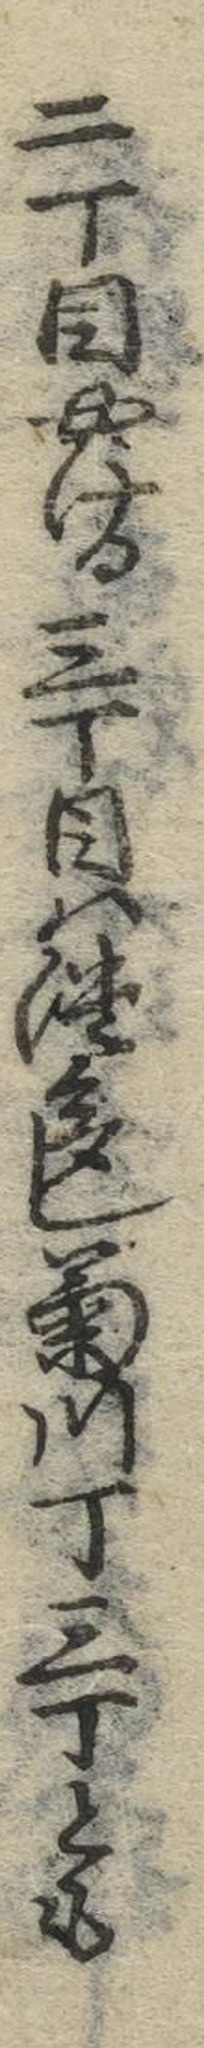二丁目やける三丁目ハ潰多し菊川丁三丁とも
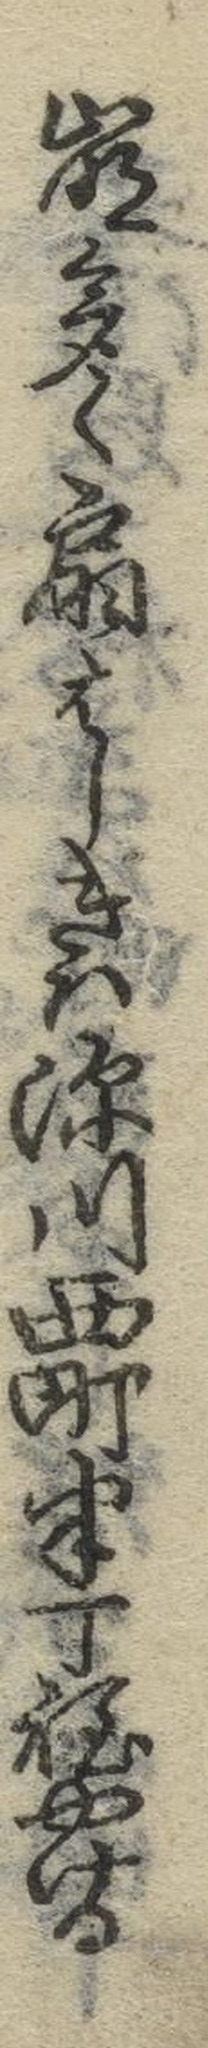崩多く扇はしきハ深川西町半丁程やける
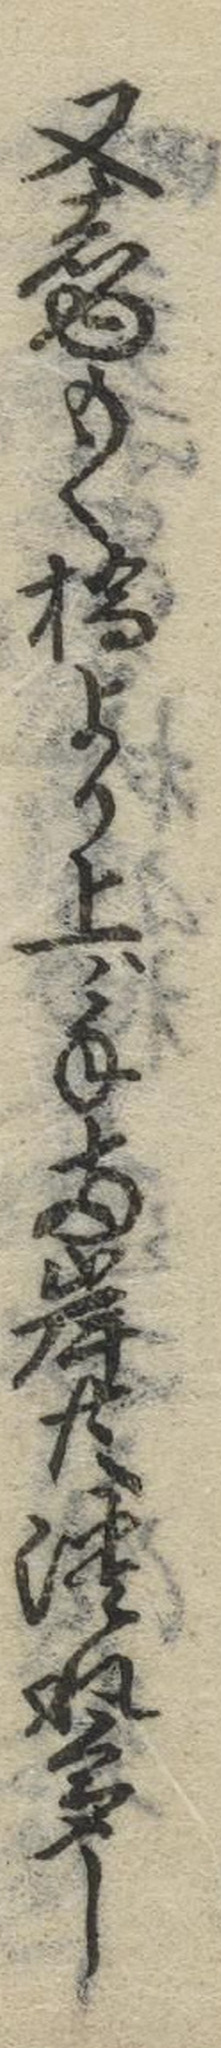又しゆもく橋より上ハ手両岸共潰れ多し
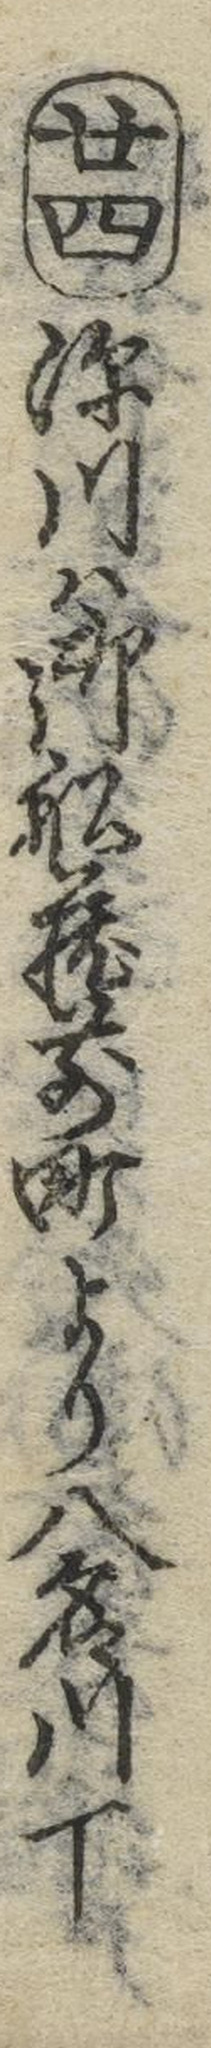廿四深川ハ御船蔵前町より八名川丁
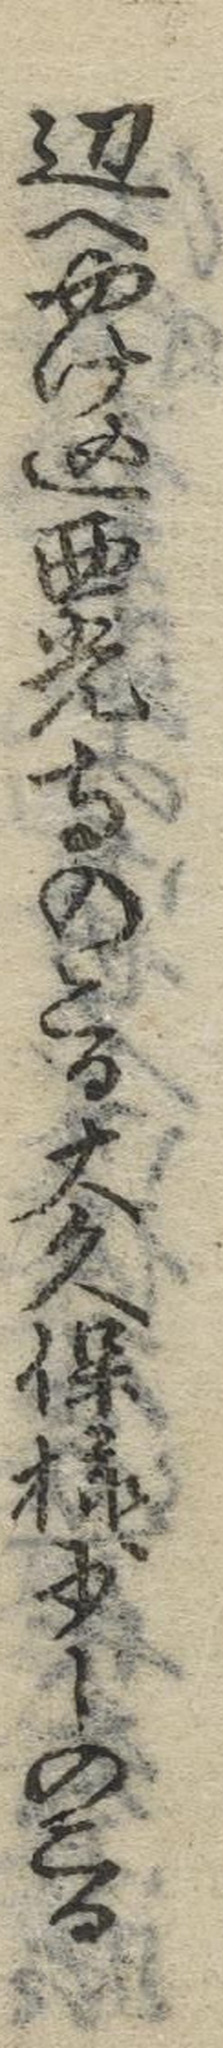辺へやけ込西光寺のこる大久保様少しのこる
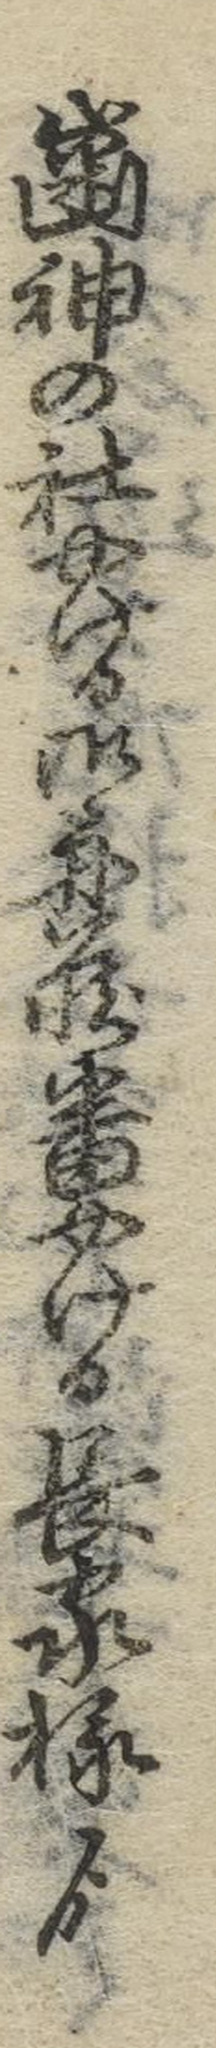歯神の社やける御舟蔵番やける長家様ゟ
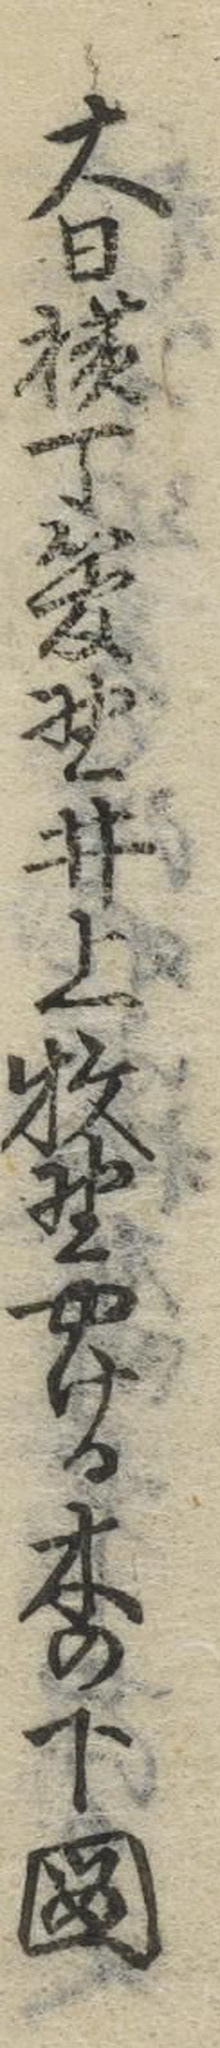大日横丁菅野井上牧野やける木の下図
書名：江戸御屋鋪方町方共　地震類焼場所巨細書之寫　潰家潰土蔵共取調附街道筋近在迄
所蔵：東京大学地震研究所図書室 Earthquake Research Institute Library, The University of Tokyo, JAPAN
